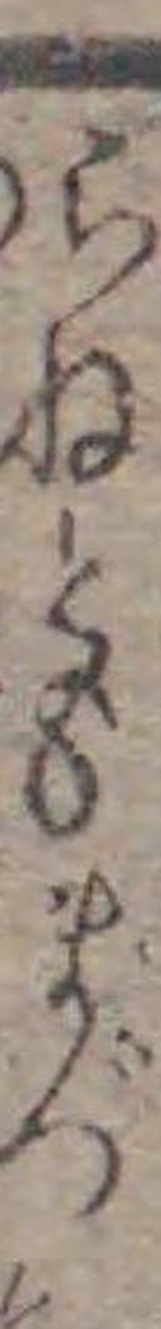らねともまづ
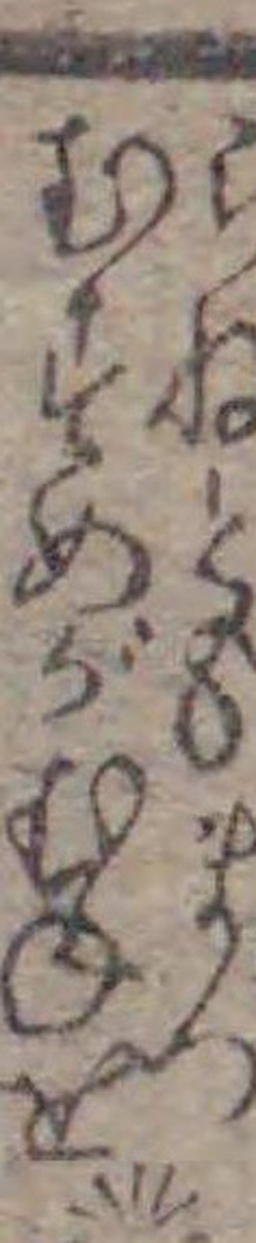むすめがむねを
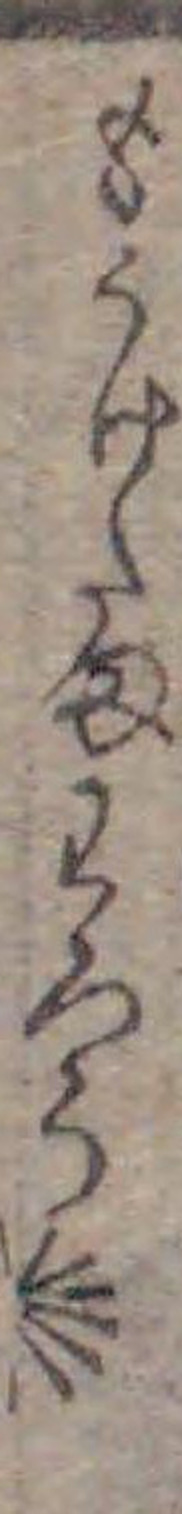もうけたまわろう

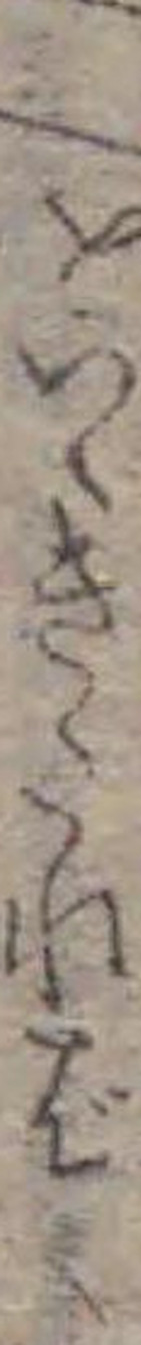をいゝきたれば
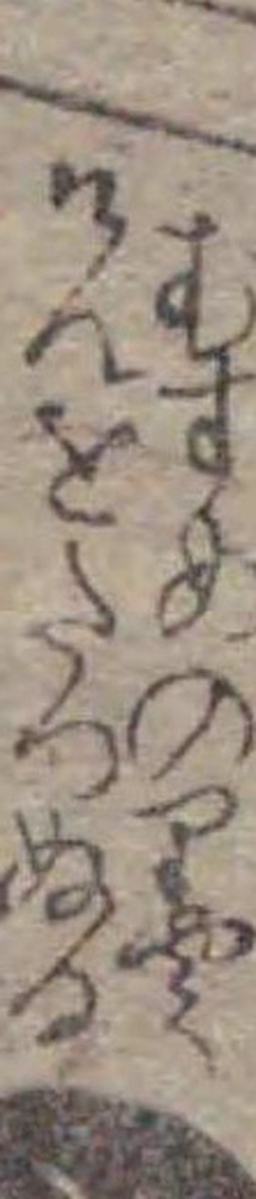けんをたつぬる
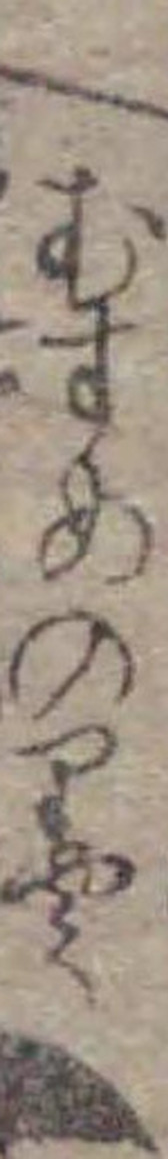むすめのりやう
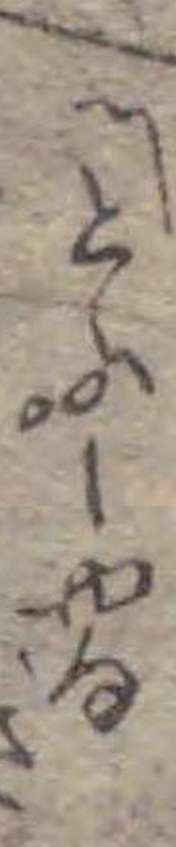〽とふしやる
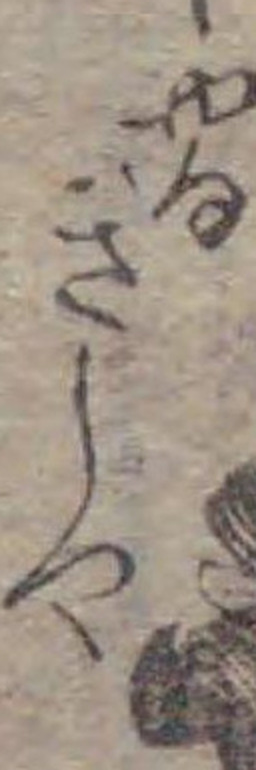きしや
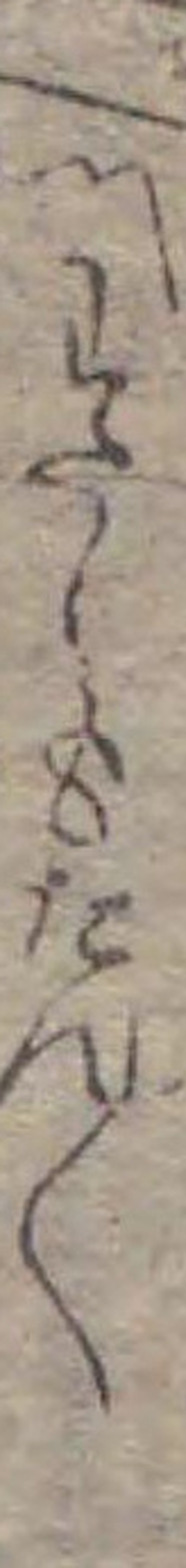〽わたしもたん〳〵
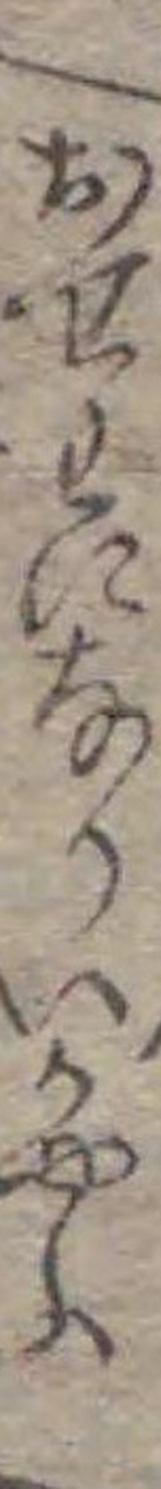おせわになりいかやふ
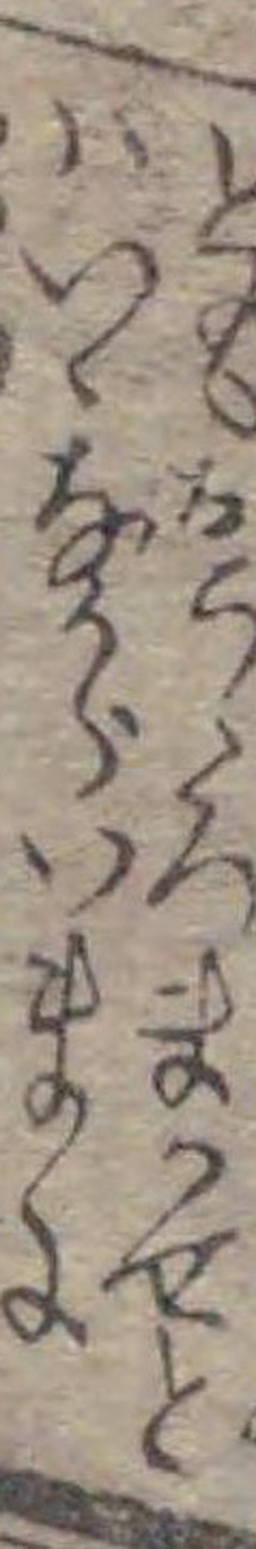はいゝなからいまに
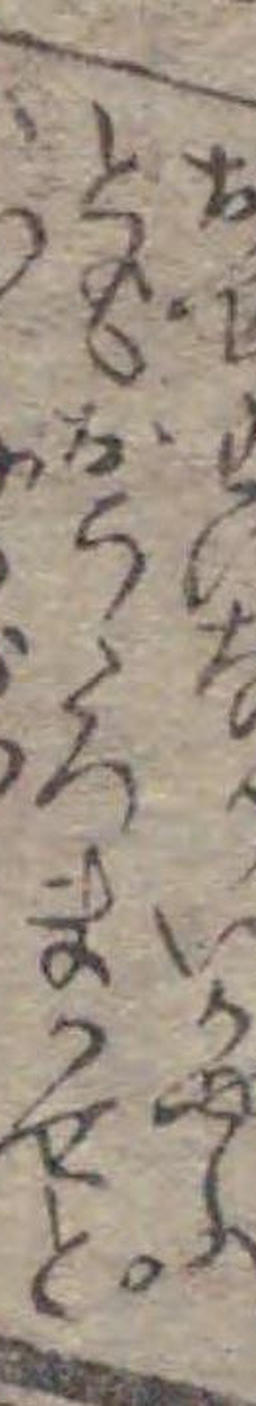ともおこゝろまかせと
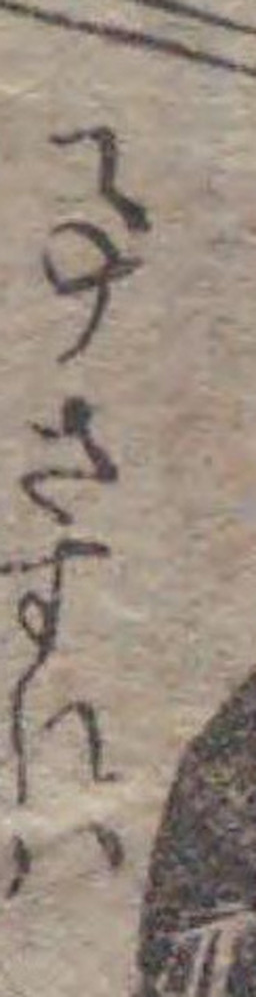事さすれは
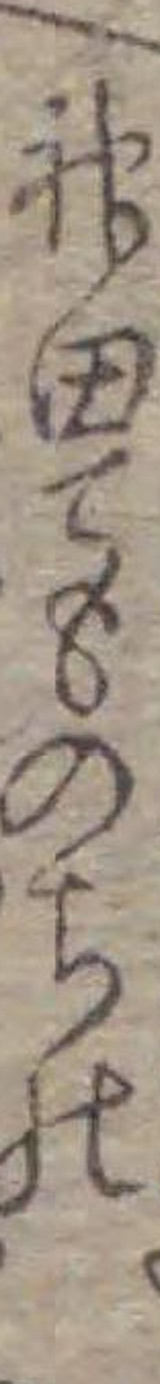神田てものちの
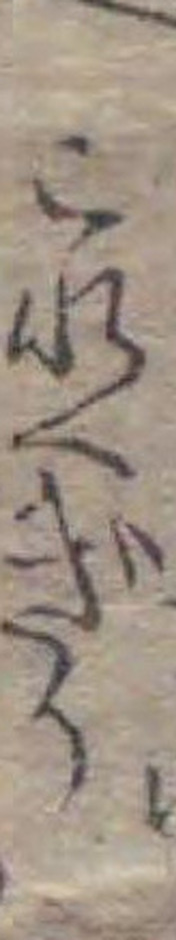これへぎり
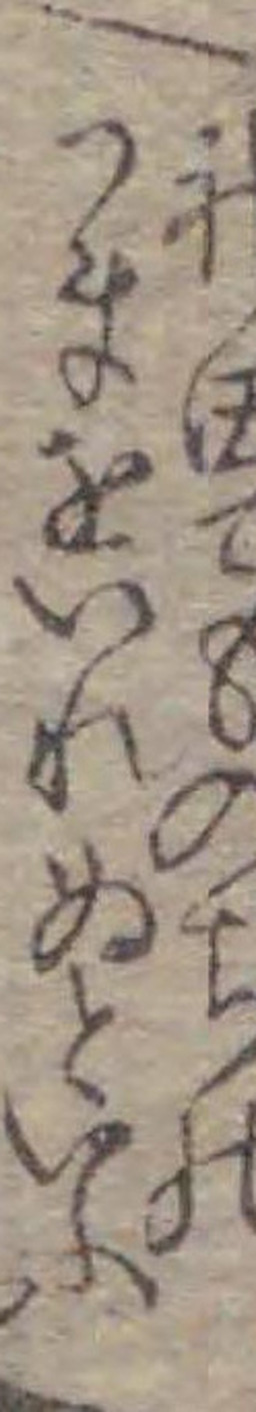つまをいれぬといふ
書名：神田与吉一代記 : 3巻
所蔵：国立国会図書館 National Diet Library, JAPAN
